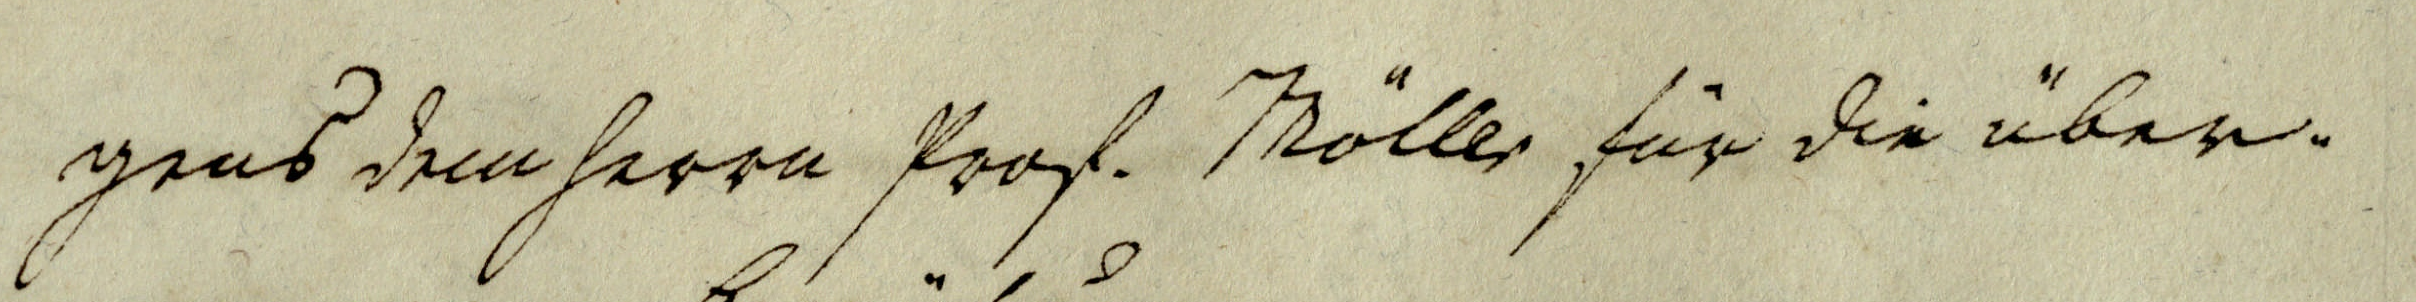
gens dem Herrn Prof. Möller für die über¬
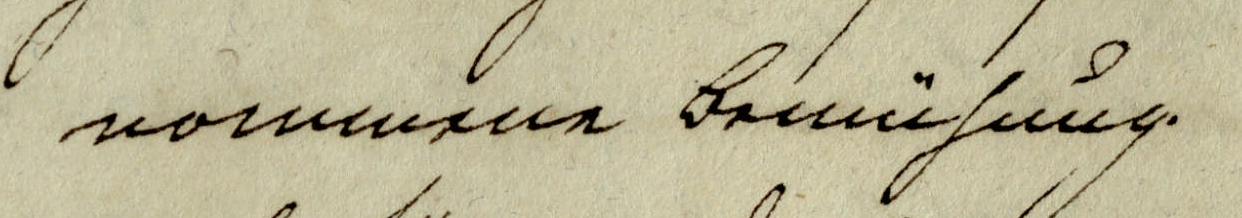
nommene Bemühung.
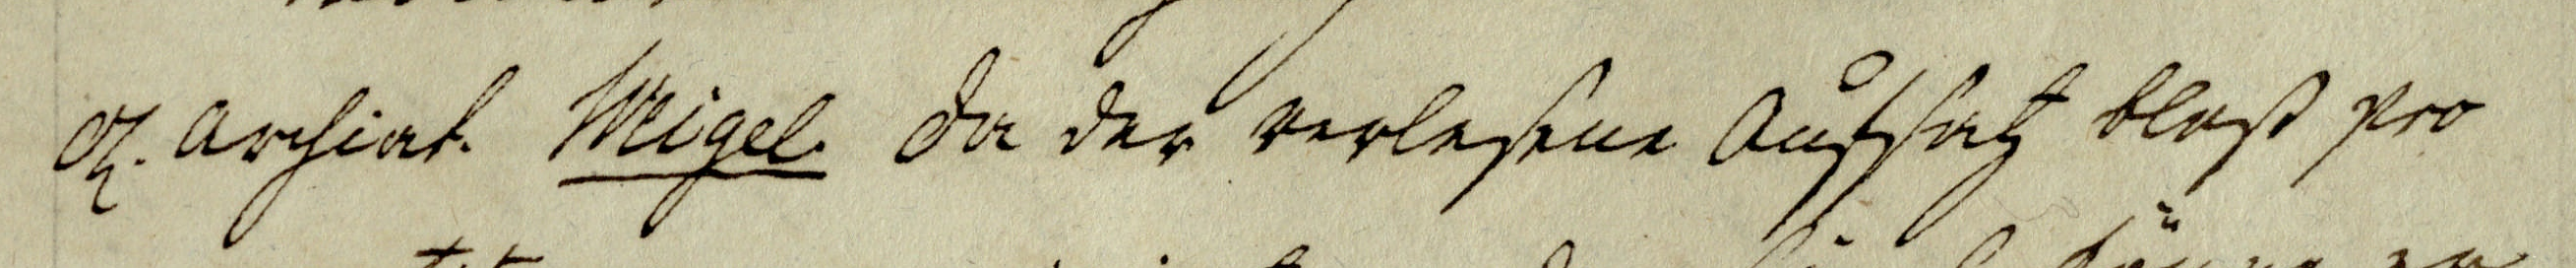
dh. Archiat. Weigel. Da der verlesene Aufsatz bloß pro
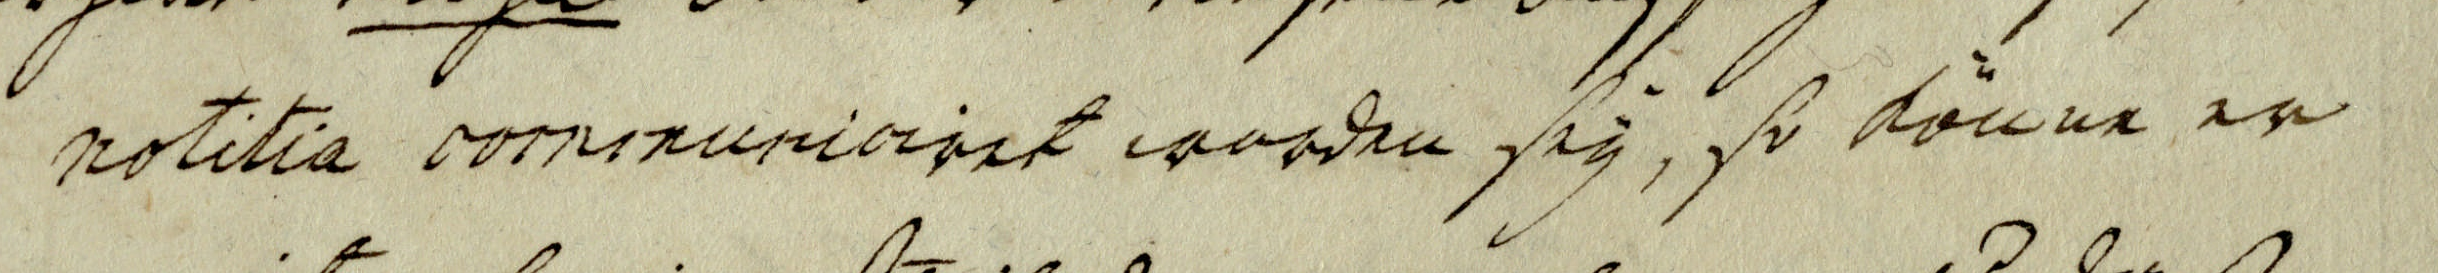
notitia communiciret worden seÿ, so könne er
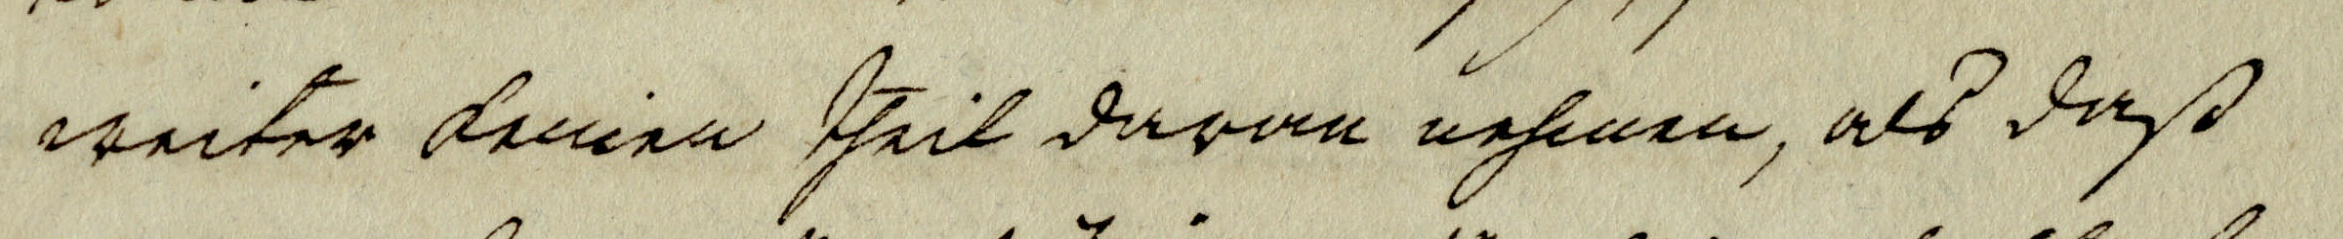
weiter keinen Theil davon nehmen, als daß
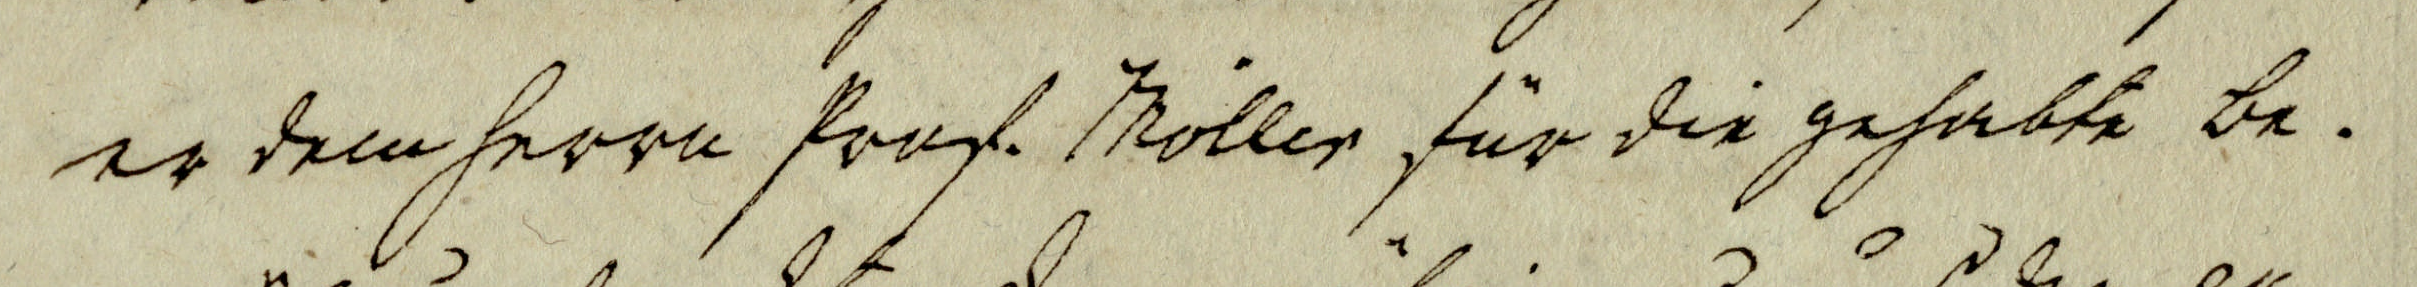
er dem Herrn Prof. Möller für die gehabte Be¬
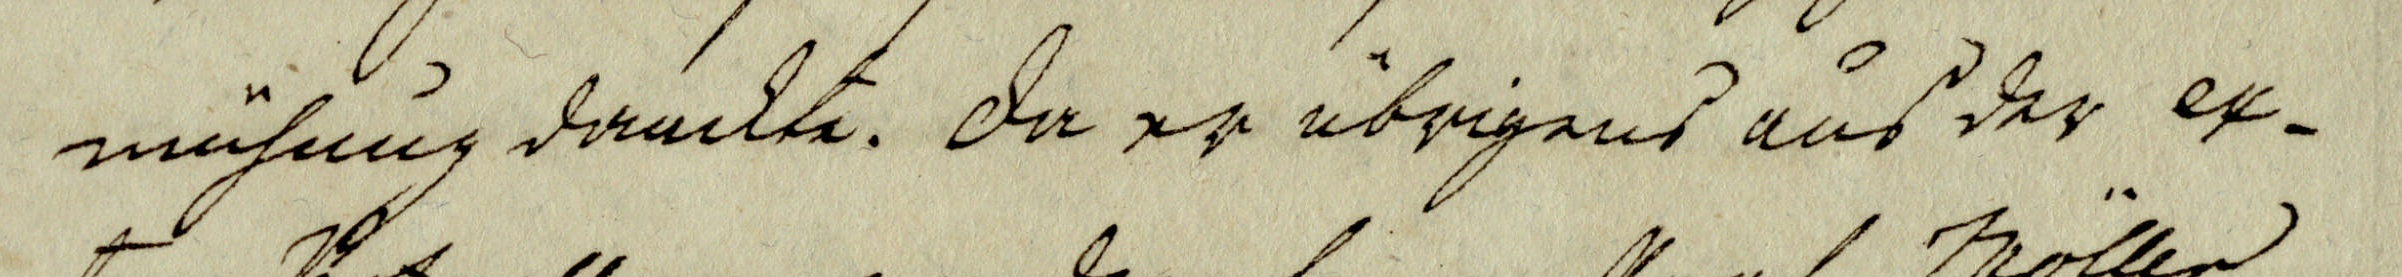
mühung danckte. Da er übrigens aus der ex¬
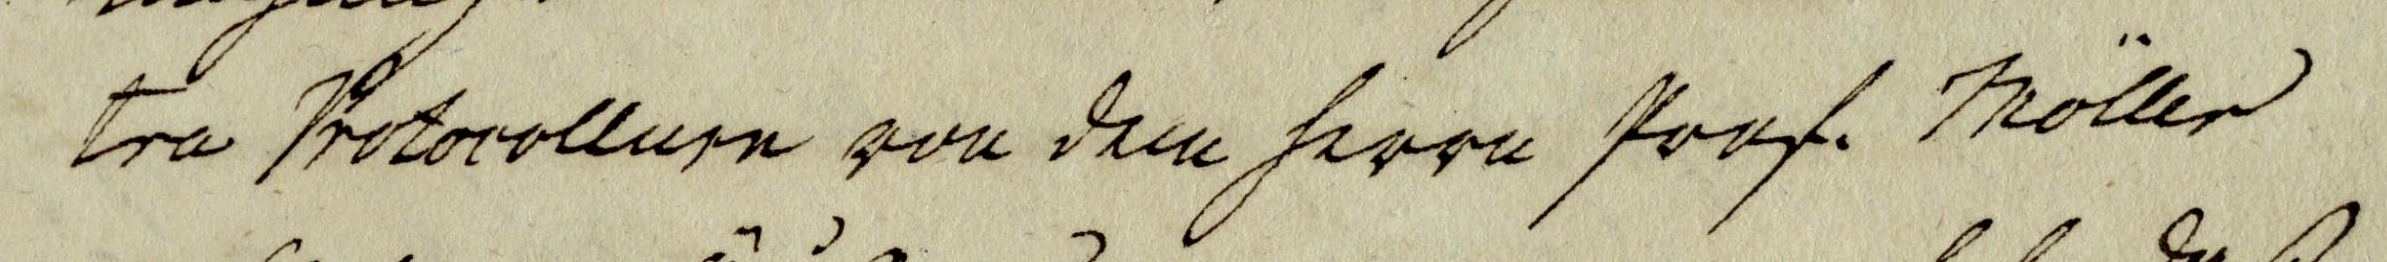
tra Protocollum von dem Herrn Prof. Möller
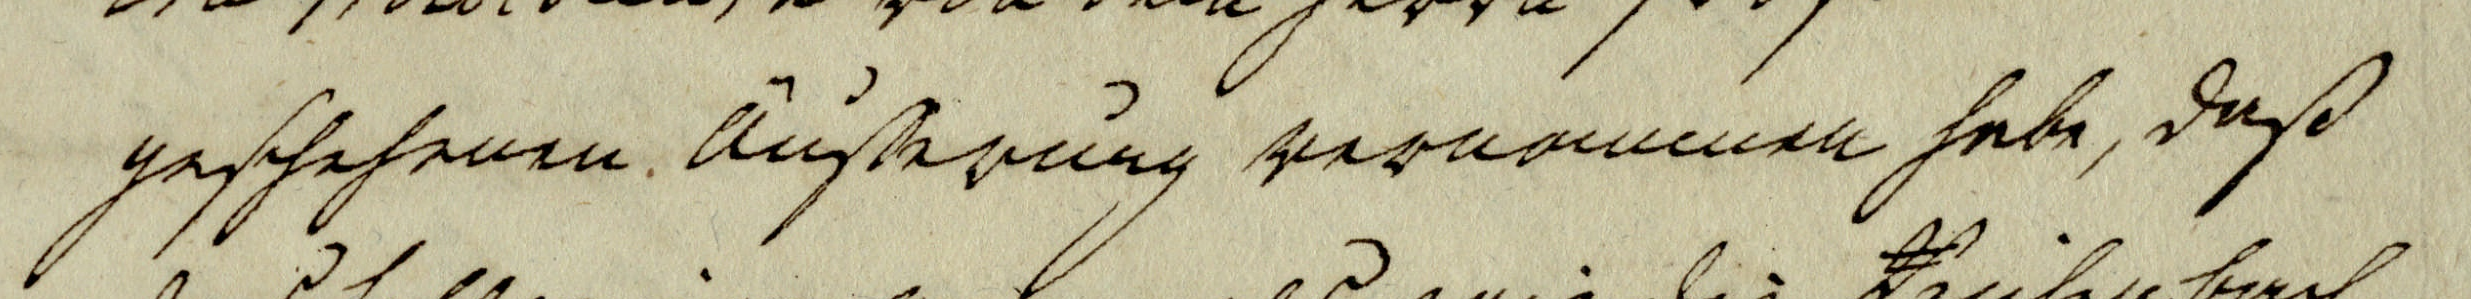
geschehenen Äusserung vernommen habe, daß
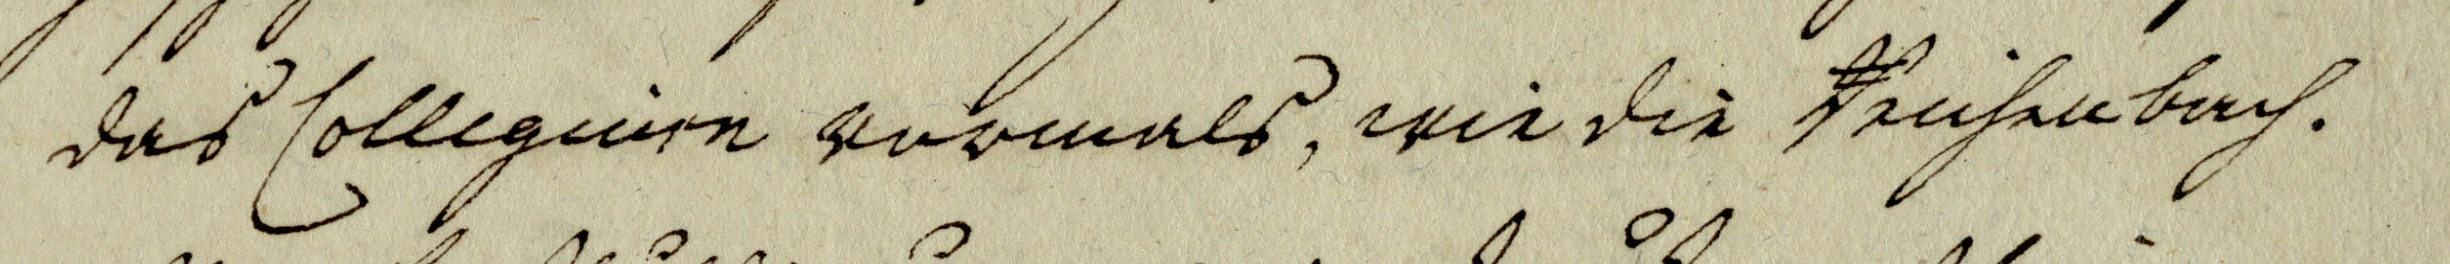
das Collegium vormals, wie die Reichenbach¬
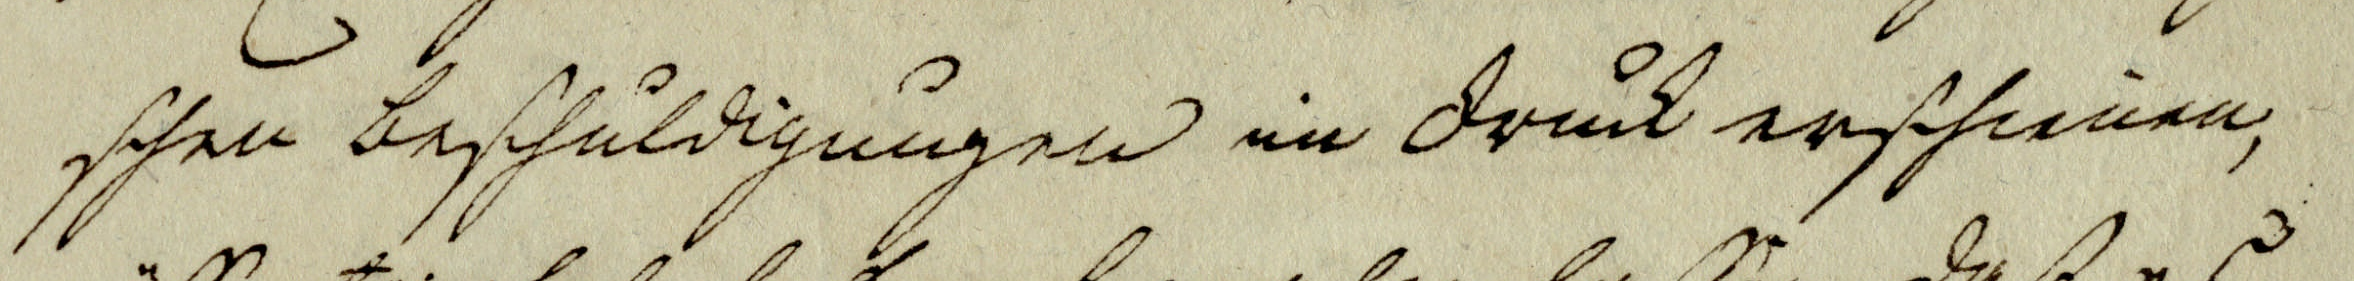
schen Anschuldigungen im Druck erschienen,
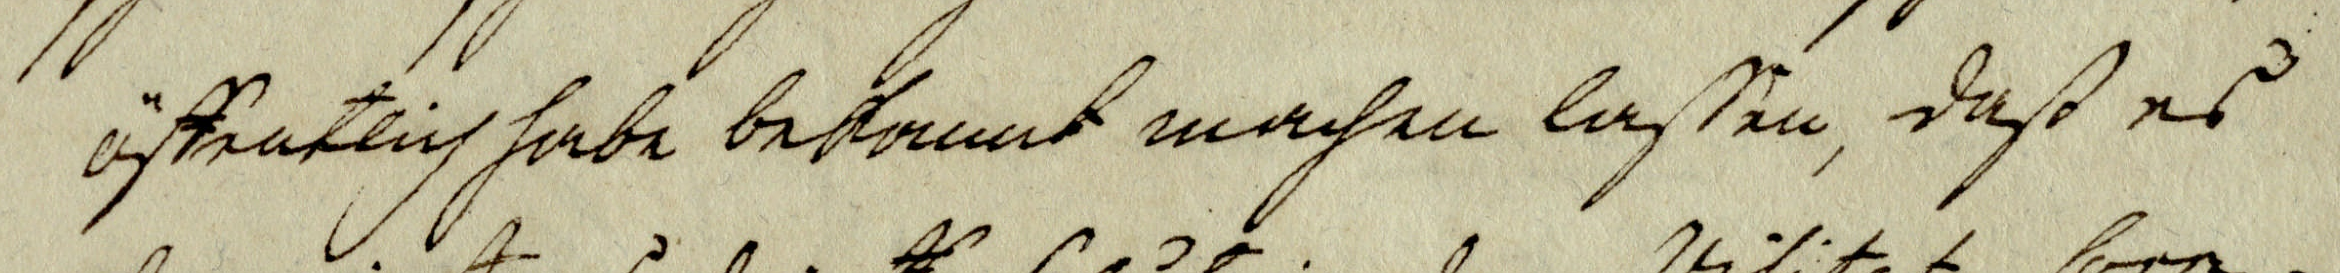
öffentlich habe bekannt machen lassen, daß es
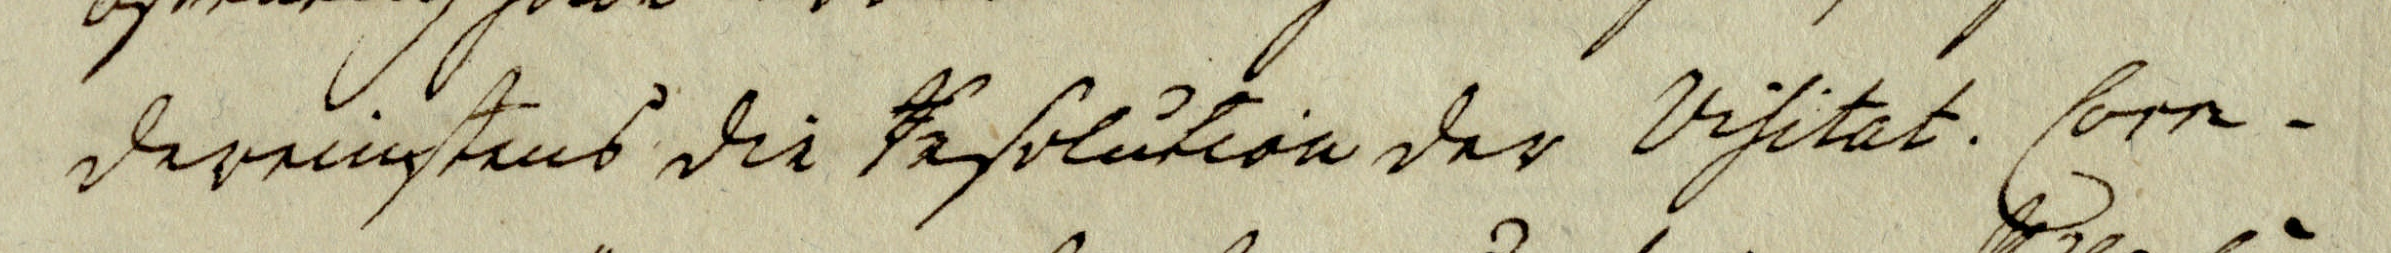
dereinstens die Resolution der Visitat. Com¬
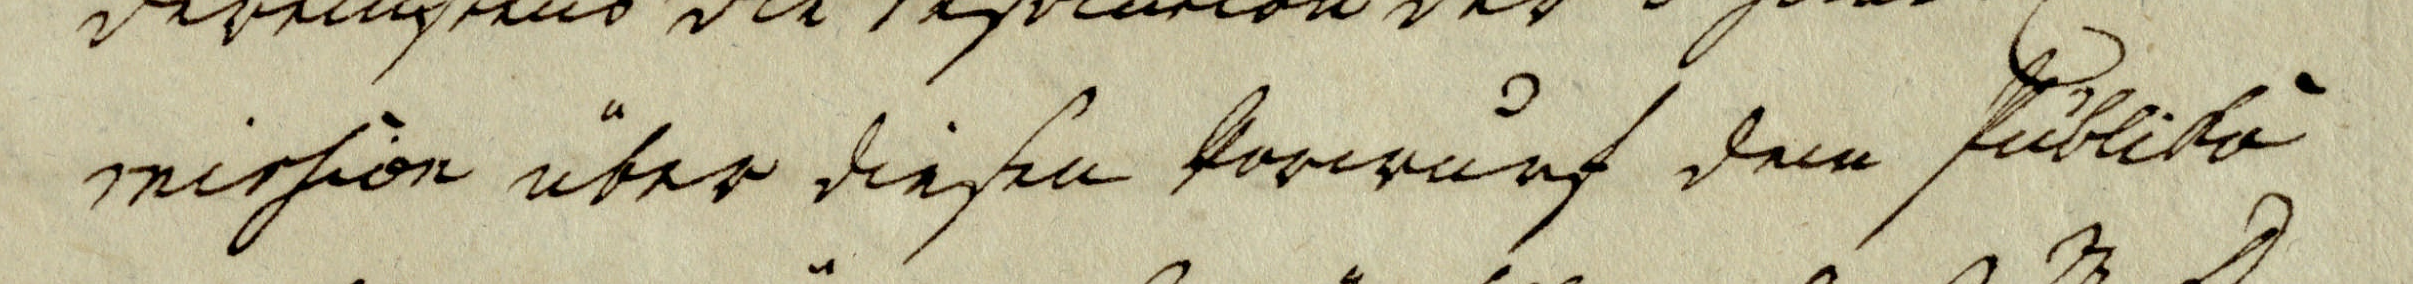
mission über diesen Vorwurf dem Publiko
